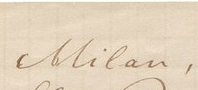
Milan,
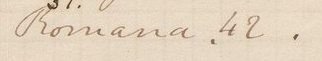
Romana. 42.
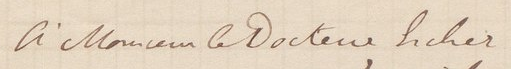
À Monsieur le Docteur Escher
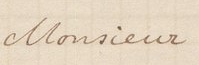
Monsieur
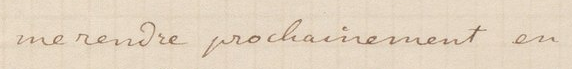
dois me rendre prochainement en
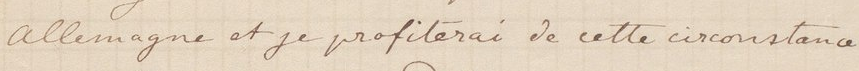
Allemagne et je profiterai de cette circonstance
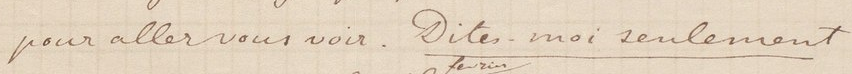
pour aller vous voir. Dites-moi seulement
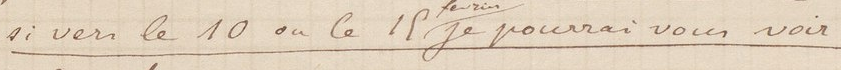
si vers le 10 ou le 15fevrier je pourrai vous voir
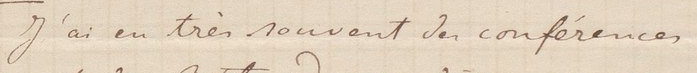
J'ai eu très souvent des conférences
